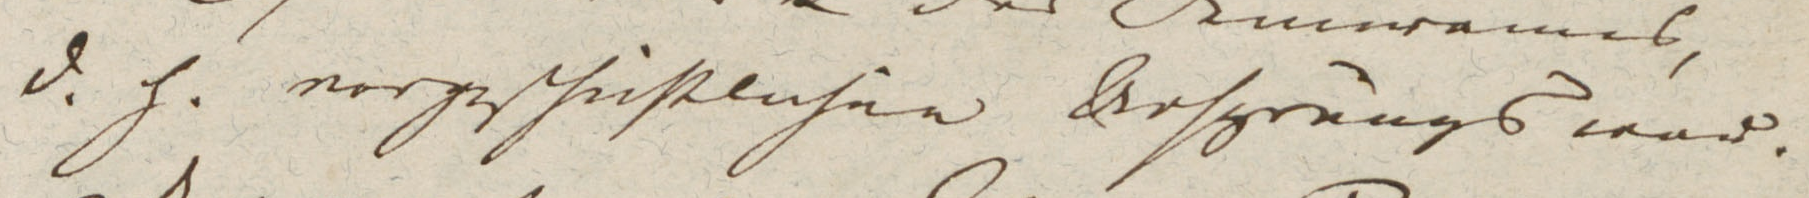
d. h. vorgeschichtlichen Ursprungs war.
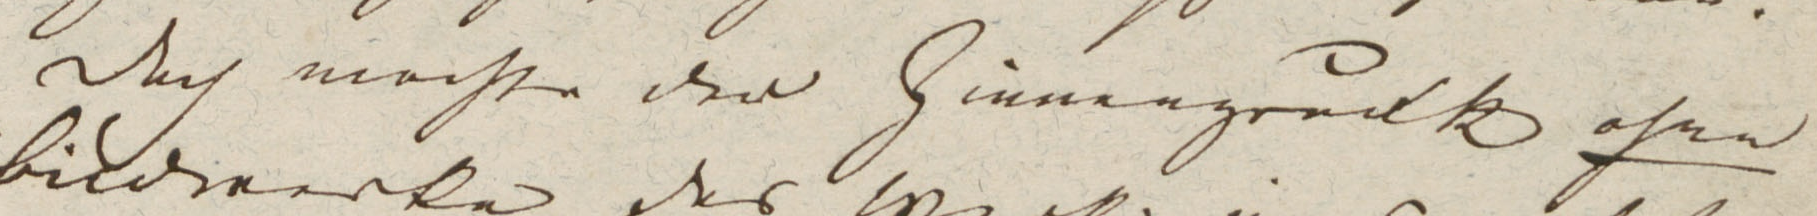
Doch mochte der Zinnenprunk ohne
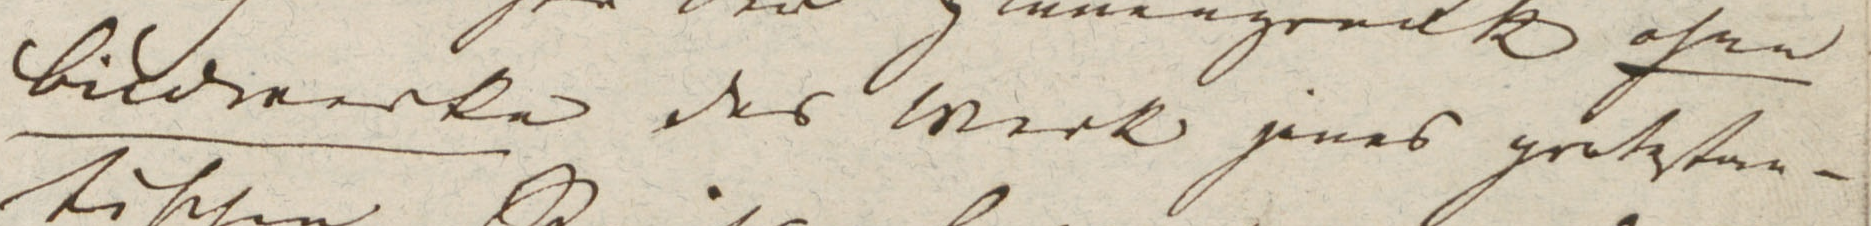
Bildwerke das Werk jenes protestan-
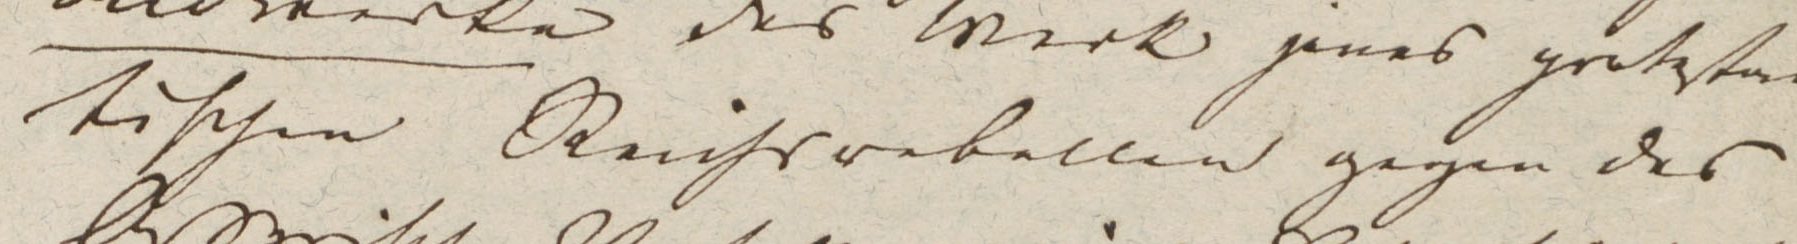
tischen Reichsrebellen gegen das
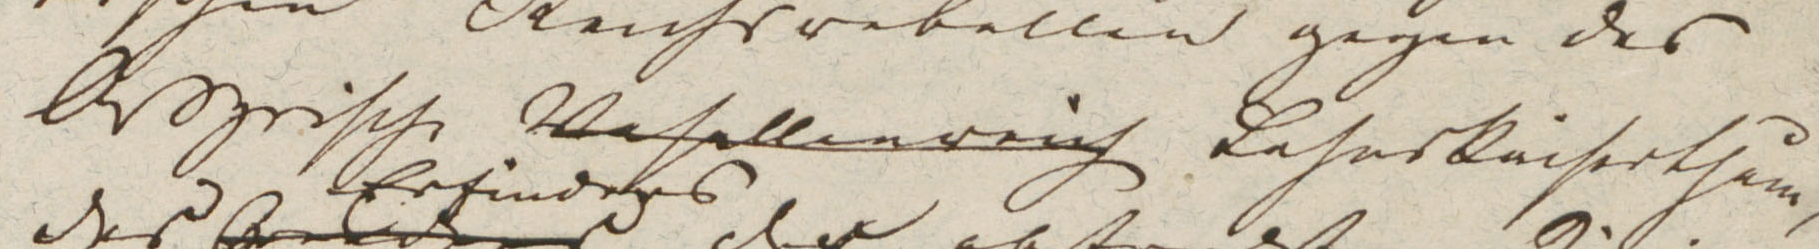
Assyrische Vasallenreich Lehnskaiserthum,
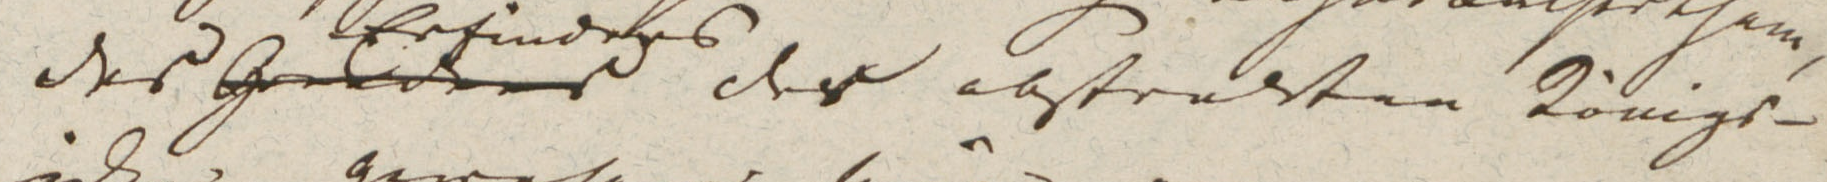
des Gründers Erfinders desr abstrakten Königs-
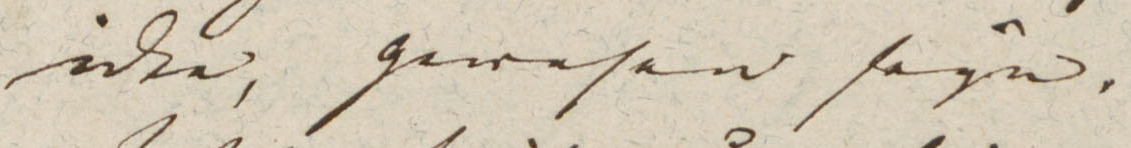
idee, gewesen seyn. –
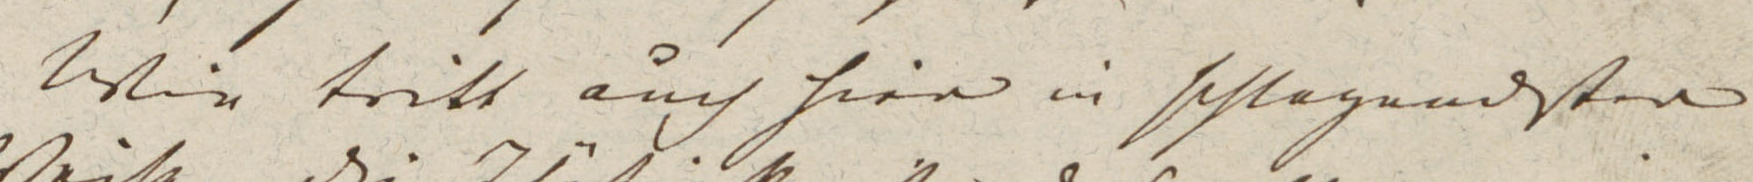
Wie tritt auch hier in schlagendster
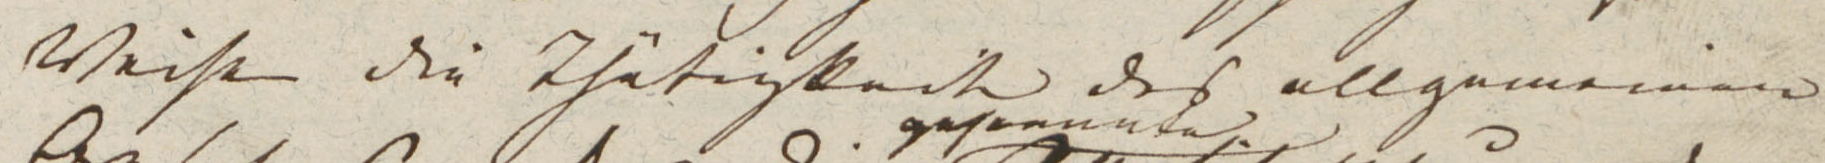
Weise die Thätigkeit des allgemeinen
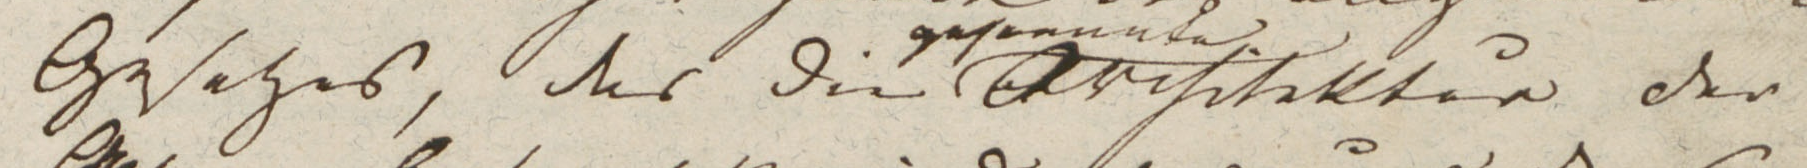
Gesetzes, das die gesammte aArchitektur der
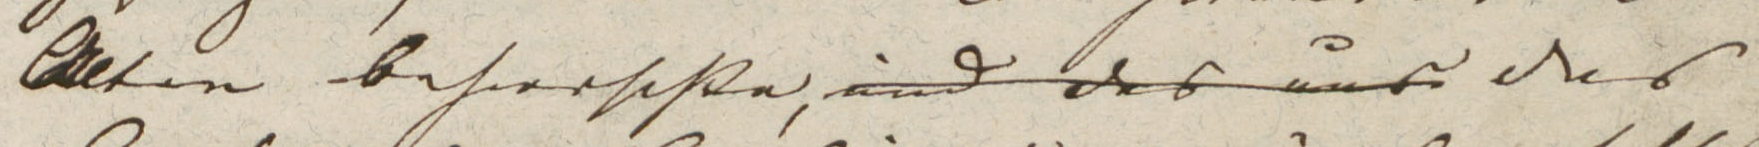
aAlten beherrschte, und das uns das
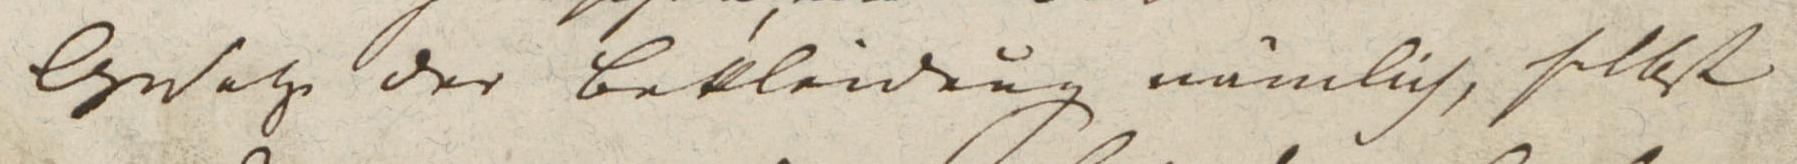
Gesetz der Bekleidung nämlich, selbst
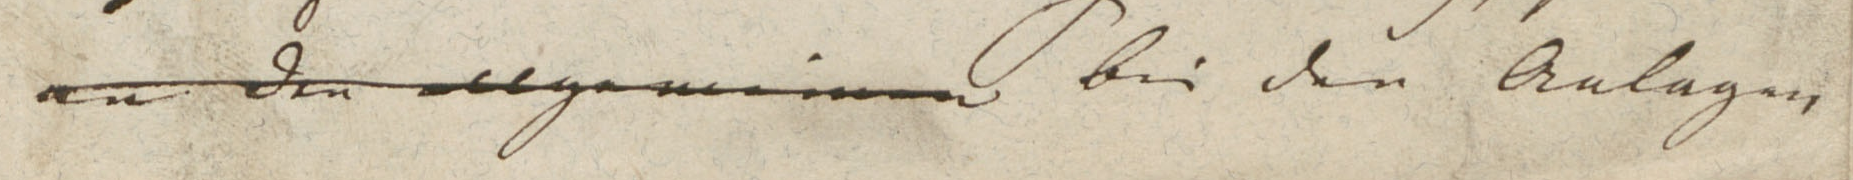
an den allgemeinen bei den Anlagen
